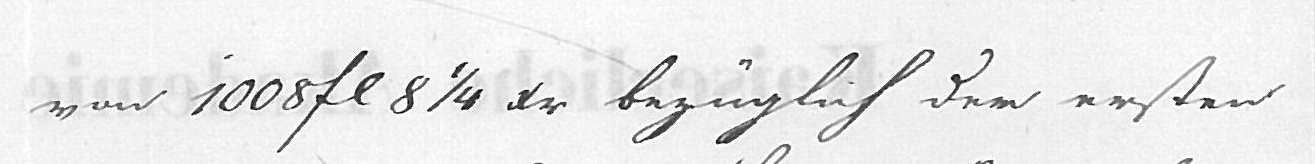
von 1008 fl 8 1/4 kr bezüglich der ersten
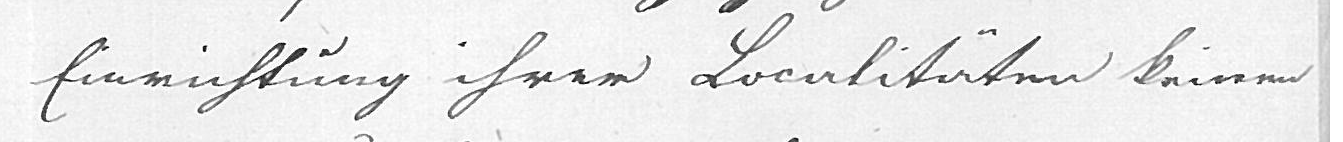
Einrichtung ihrer Localitäten keinen
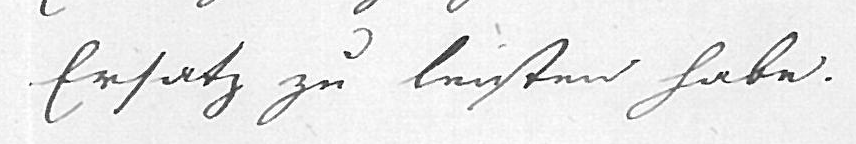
Ersatz zu leisten habe.
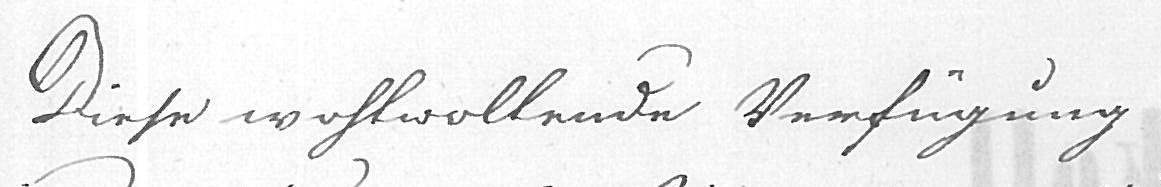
Diese wohltuende Verfügung
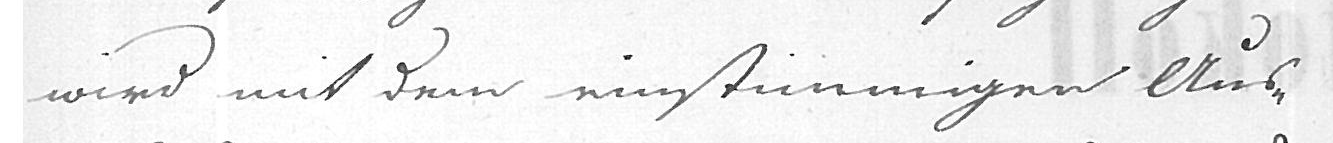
wird mit dem einstimmigen Aus-
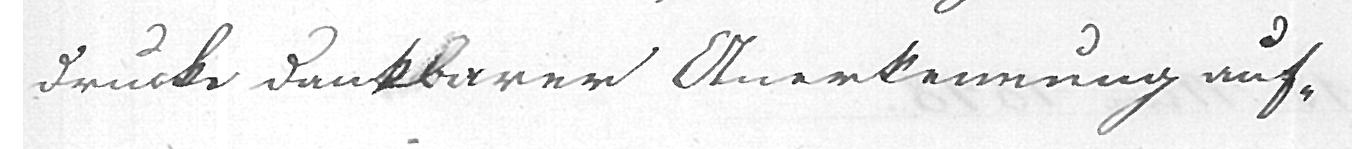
drucke dankbarer Anerkennung auf-
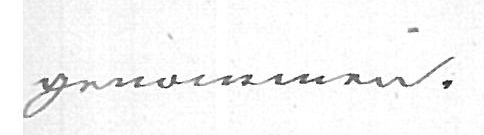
genommen.
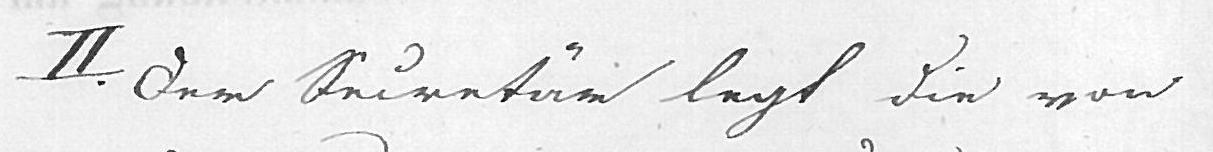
II. Der Secretär legt die von
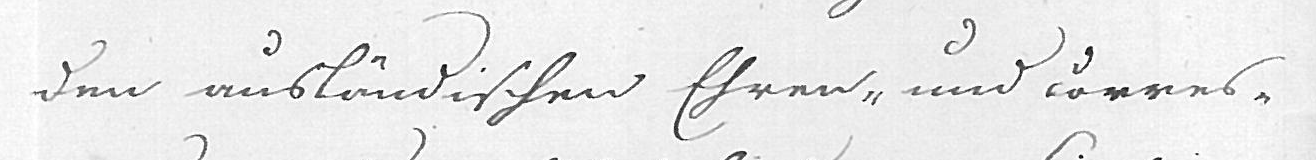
den ausländischen Ehren- und corres-
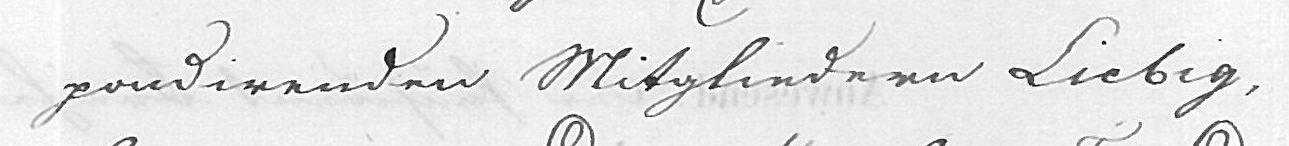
pondirenden Mitgliedern Liebig,
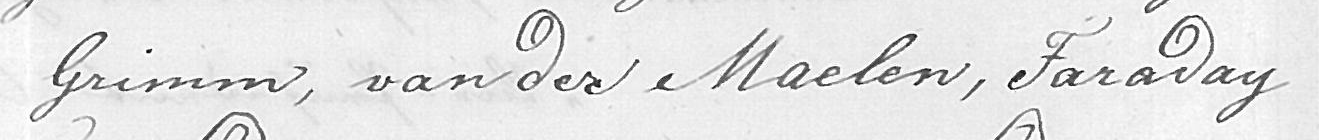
Grimm, van der Maelen, Faraday
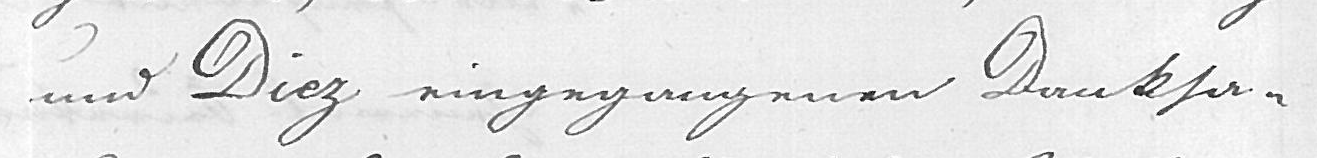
und Diez eingegangenen Danksa-
